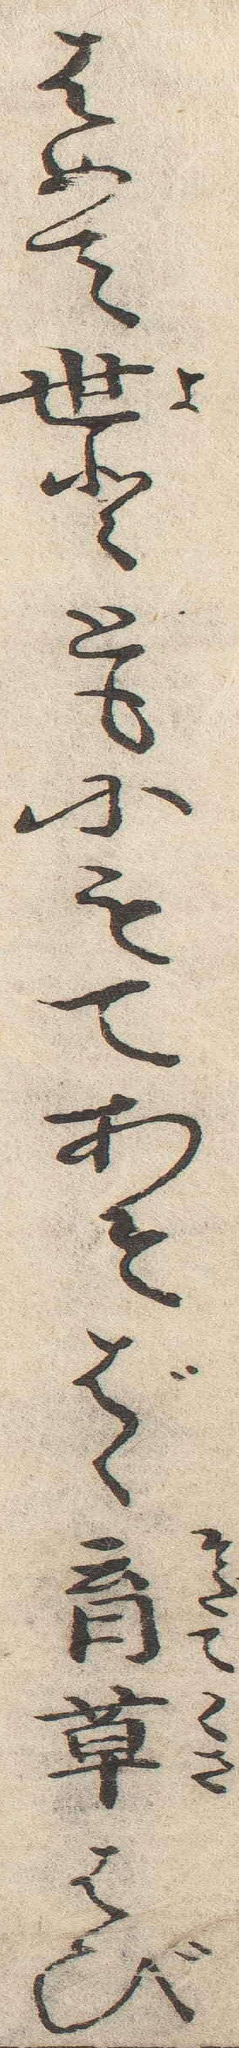はめて世とともにもてあそばゝ育草はび
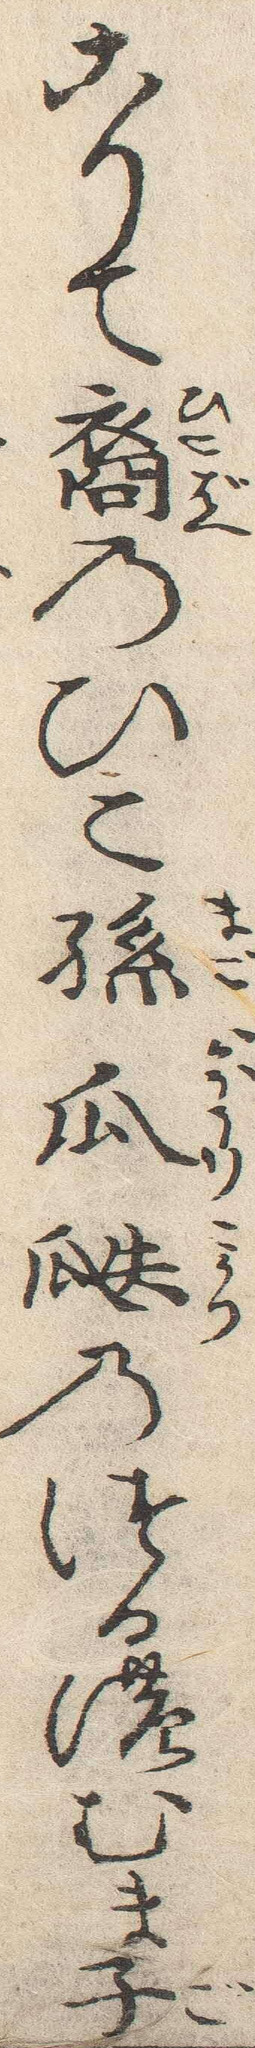こりて裔のひこ孫瓜瓞のつるのむま子
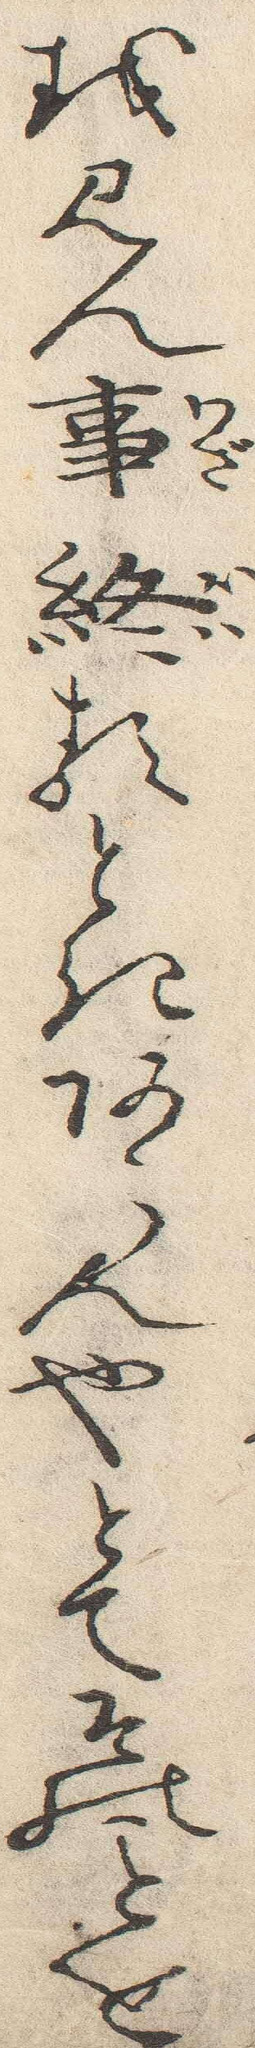を見ん事終るときあらんやとてそのことを
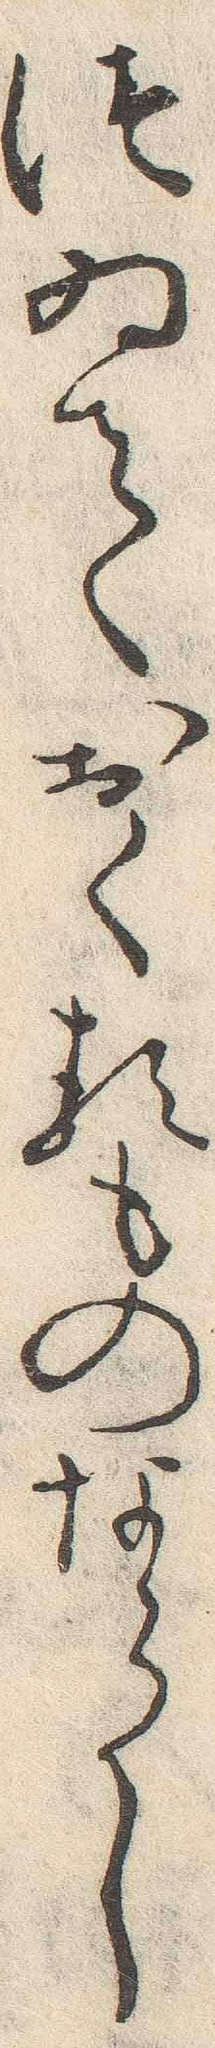つゐてゝおくるものならし
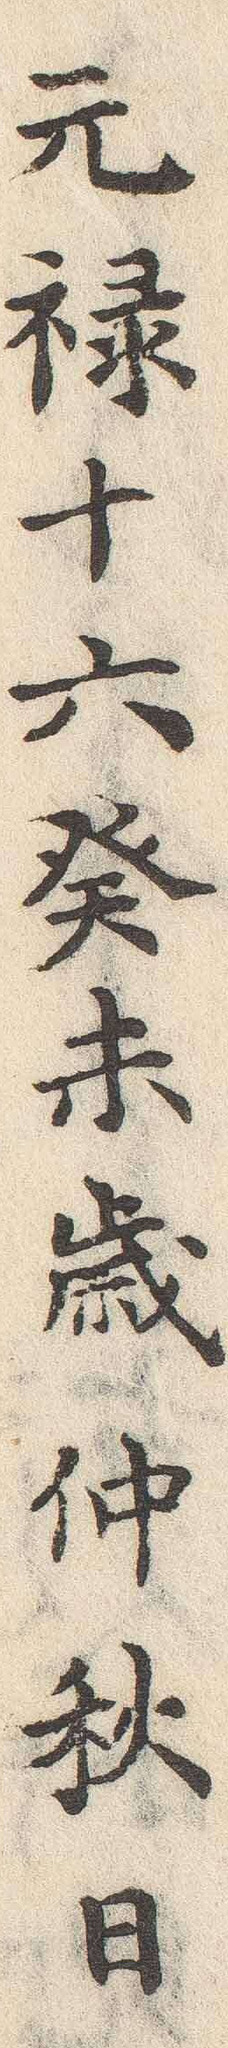元禄十六癸未歳仲秋日
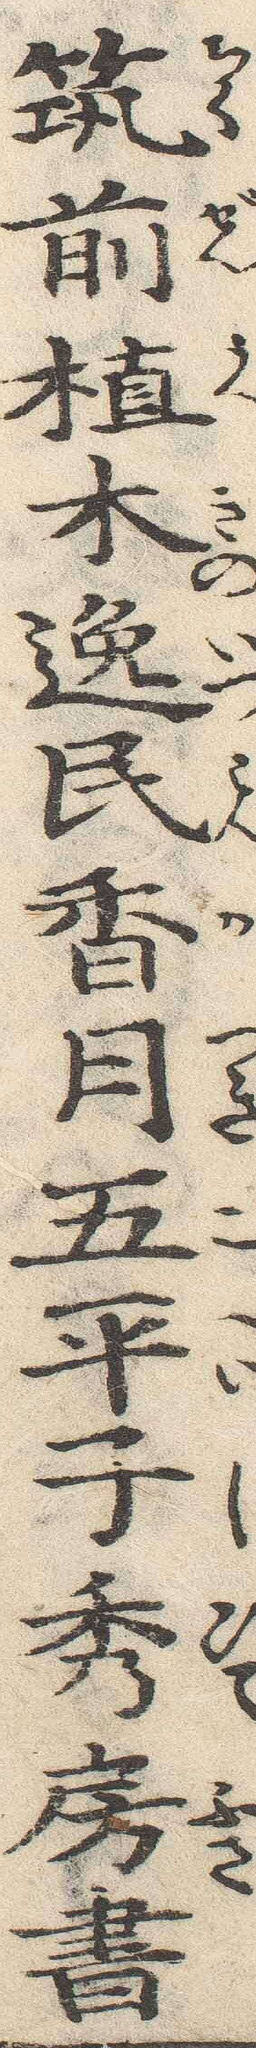筑前植木逸民香月五平子秀房書
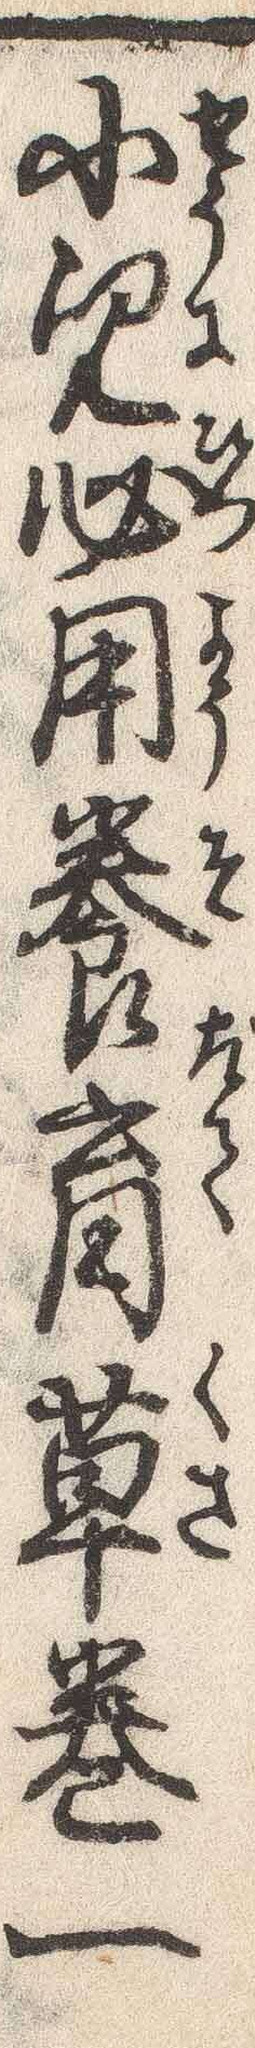小兒必用養育草巻一
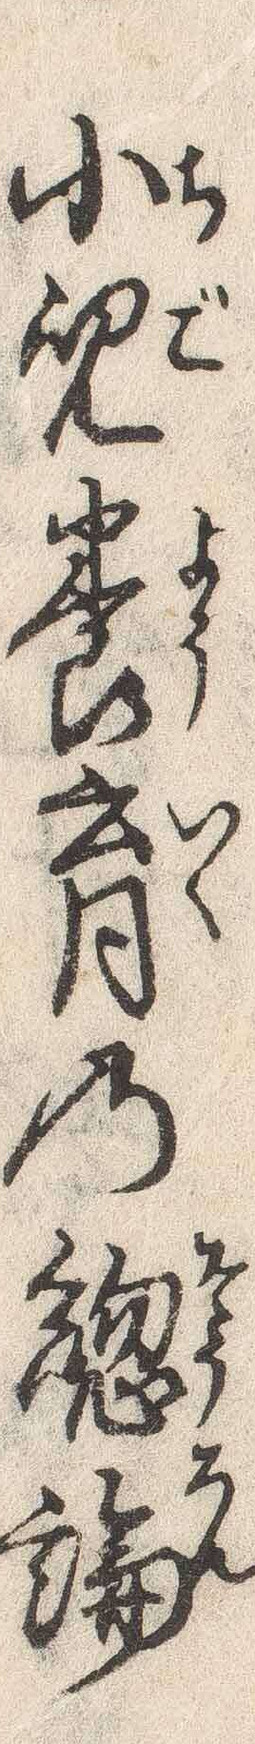㊀小兒養育の緫論
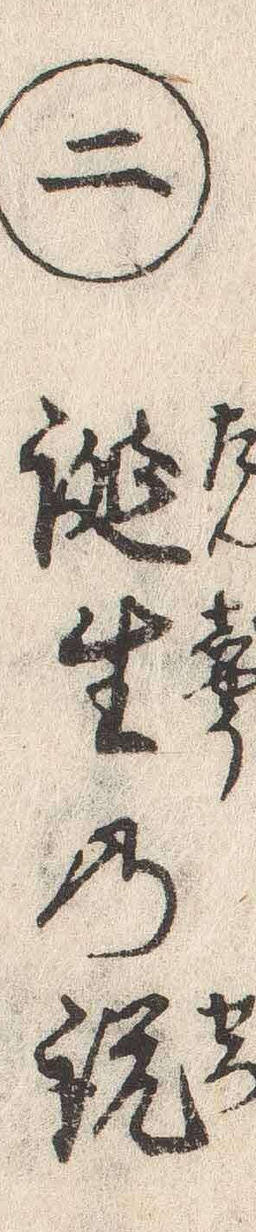㊁誕生の説
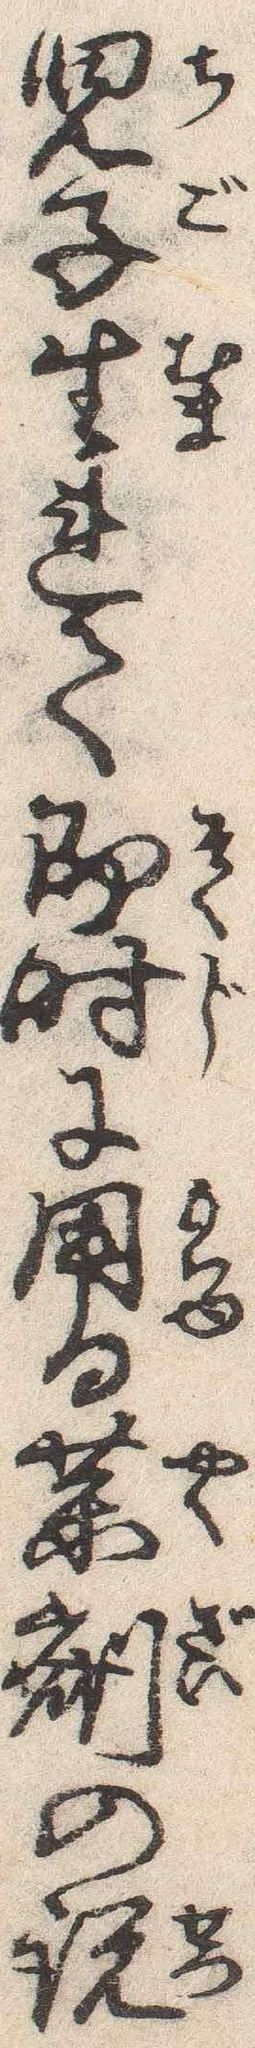㊂児子生れて即時に用る薬剤の説
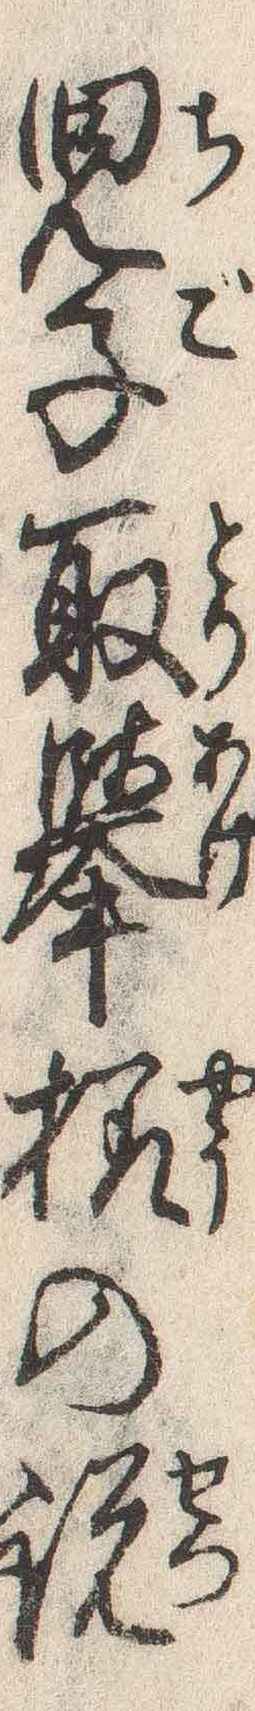㊃児子取擧様の説
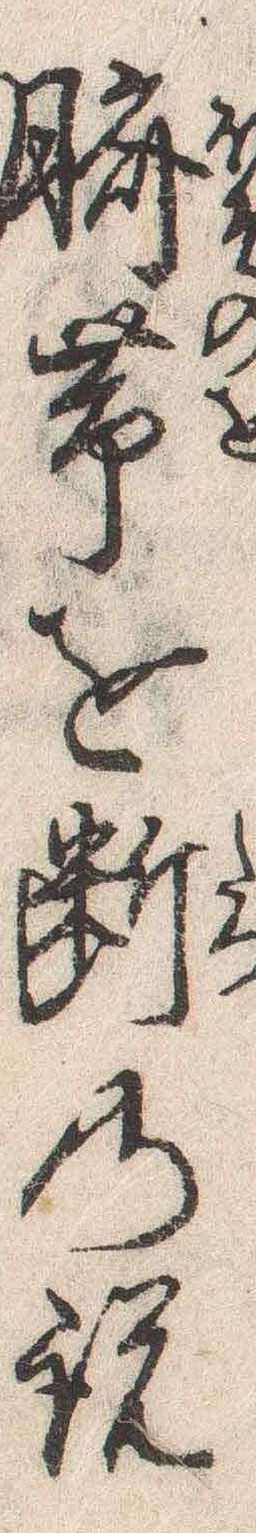㊄臍帯を断の説

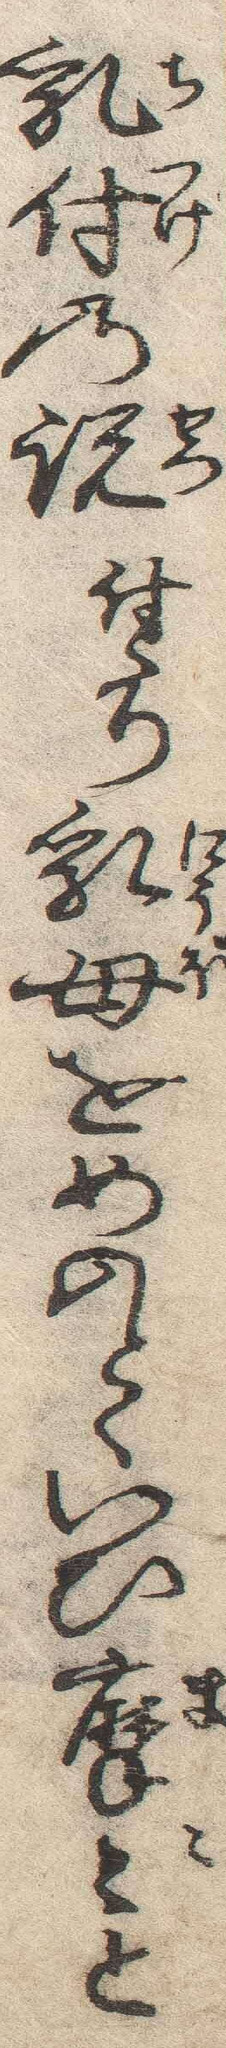㊆乳付の説付たり乳母をめのとゝいひ摩〻と
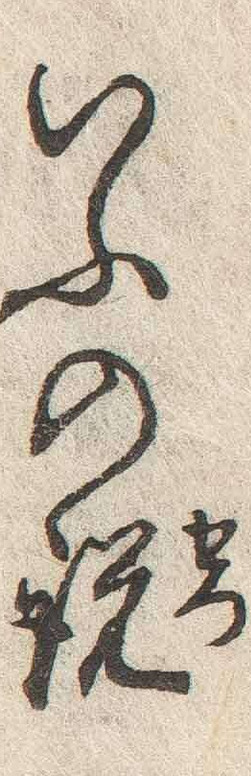いふの説
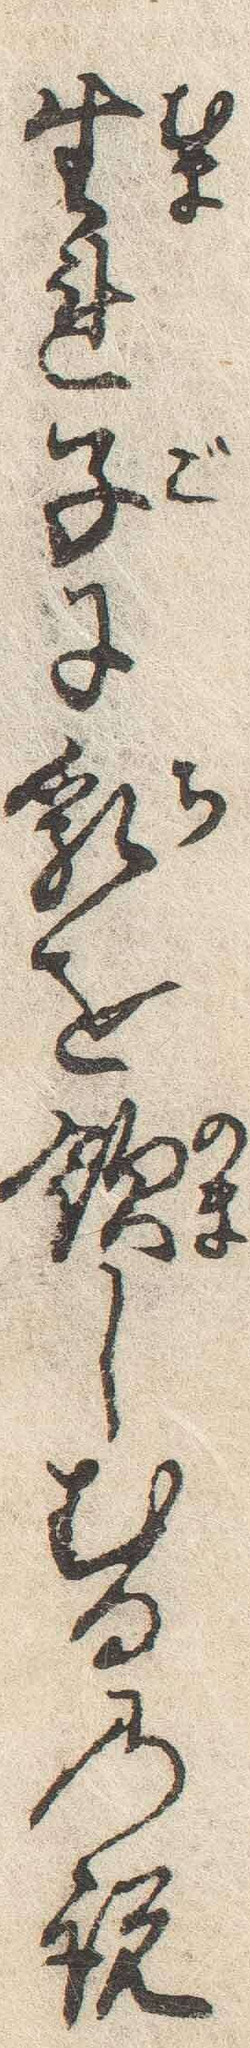㊇生れ子に乳を飲しむるの説
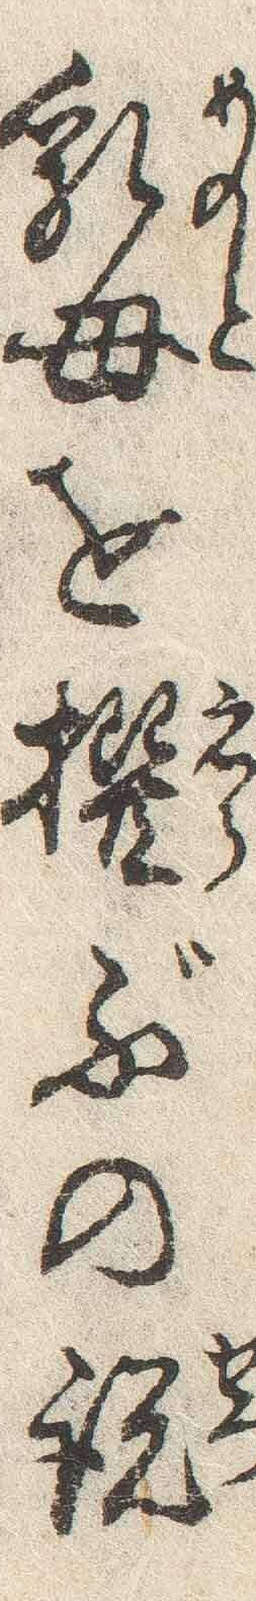㊈乳母を撰ぶの説
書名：小児必用養育草
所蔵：東京学芸大学附属図書館 国文学研究資料館
